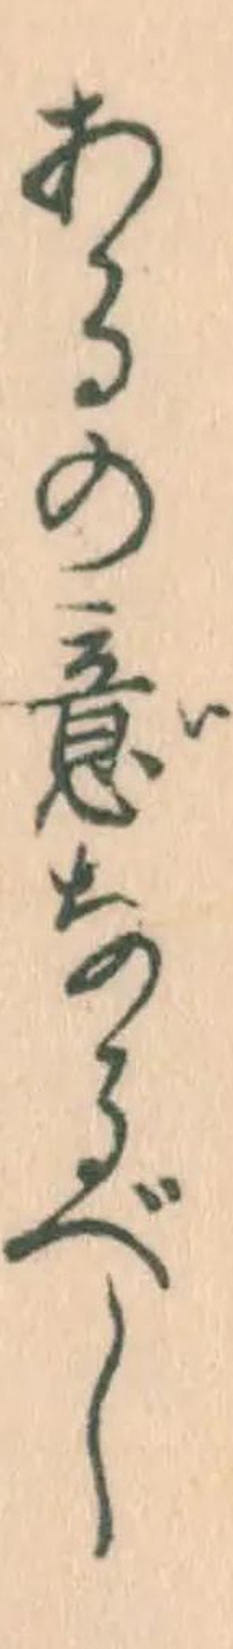あるの意なるべし

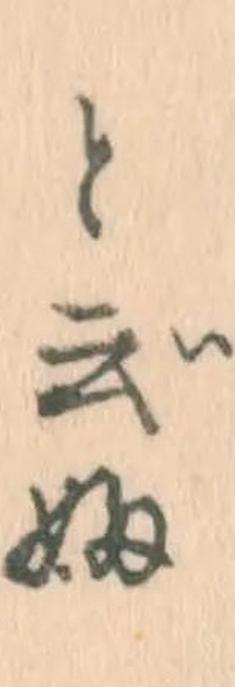と云ふ

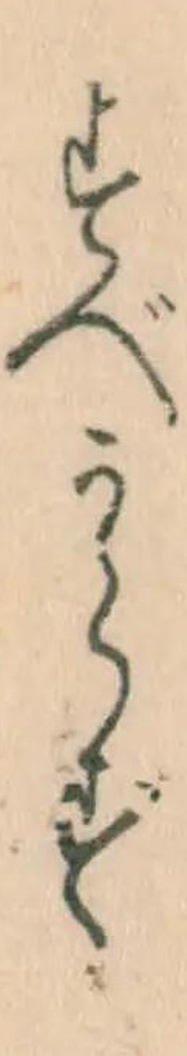すべからず

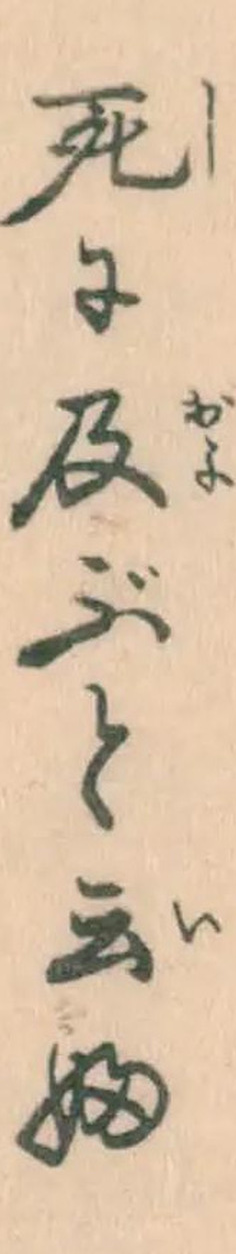死に及ぶと云ふ
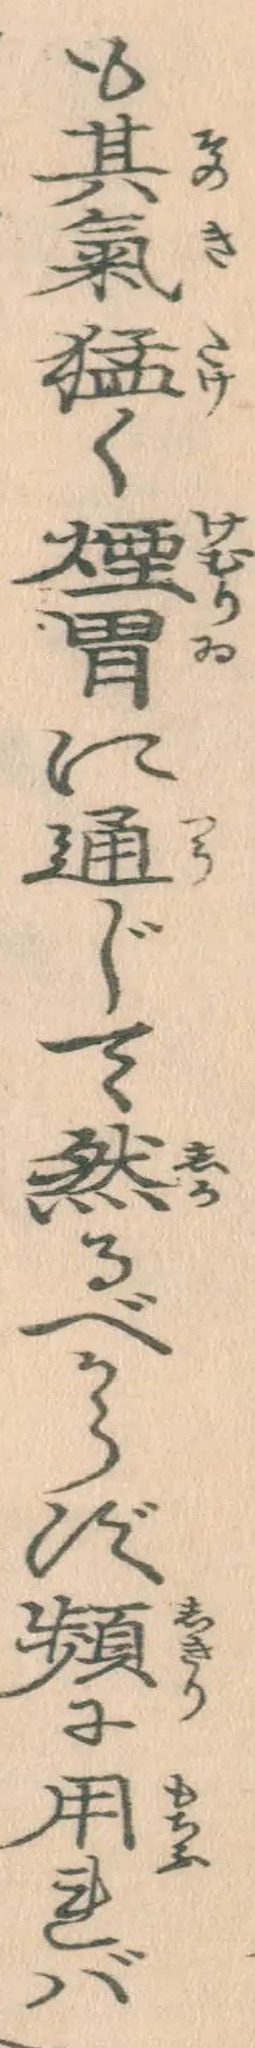も其気猛く煙胃に通じて然るべからず頻に用れば

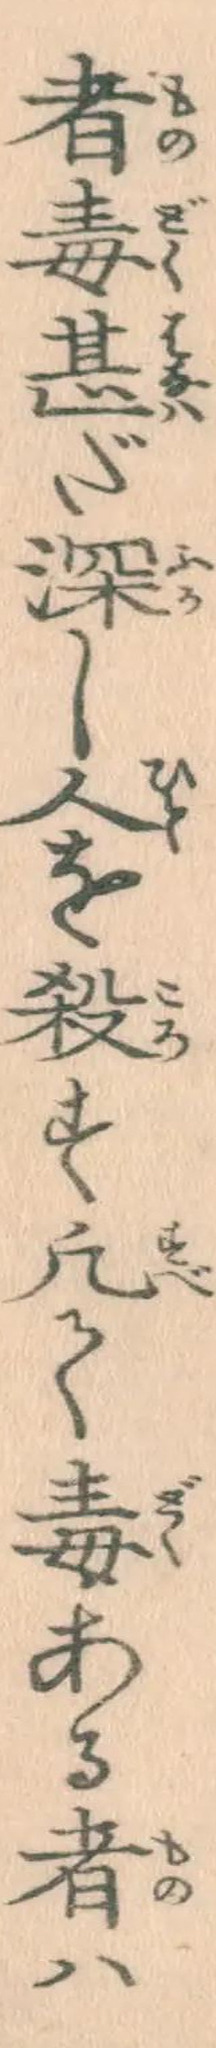者毒甚だ深し人を殺す凡て毒ある者は
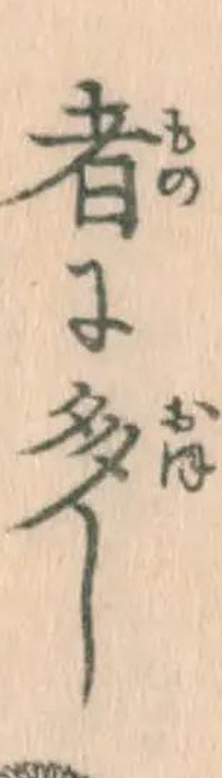者に多し
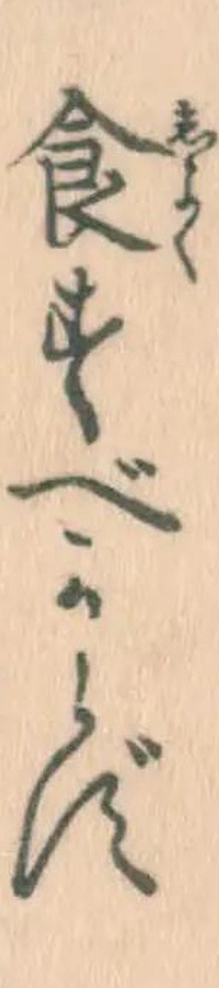食すべからず

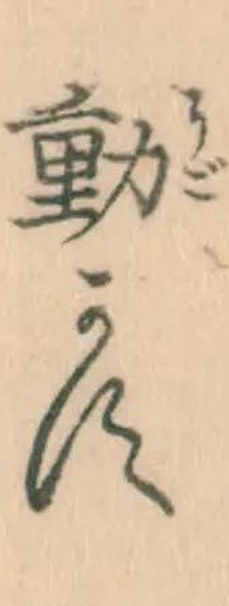動かす

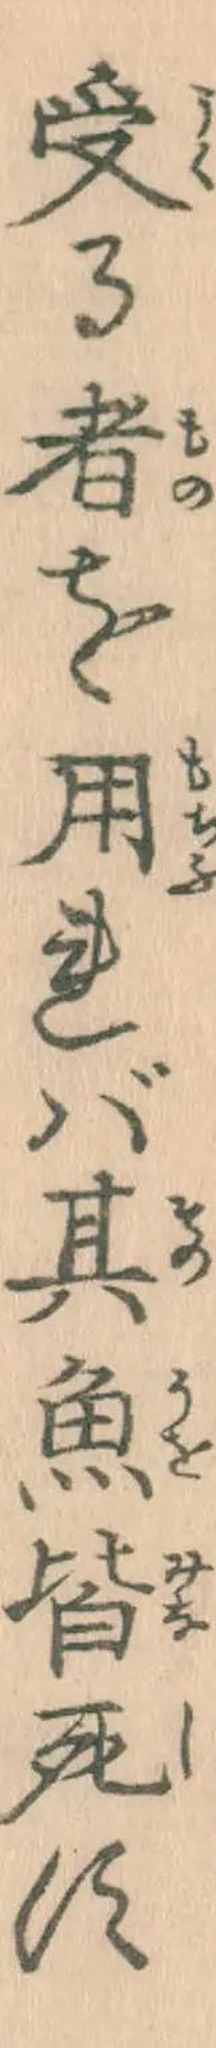受る者を用れば其魚皆死す

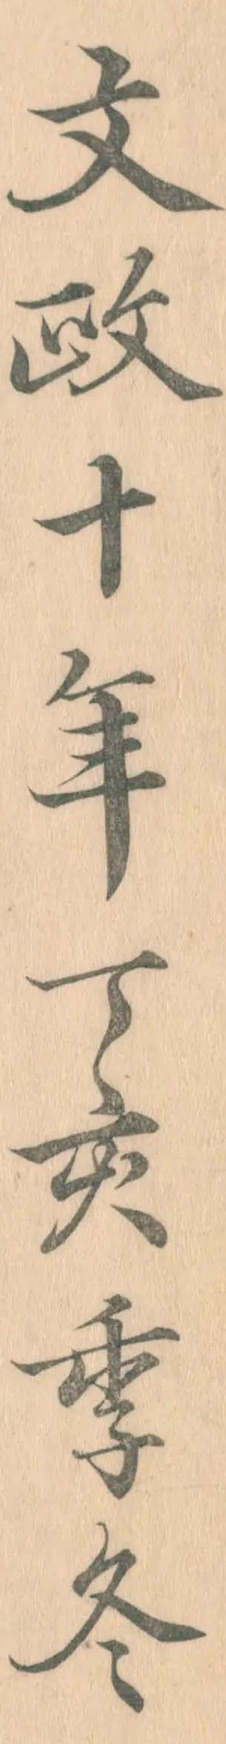文政十年丁亥季冬
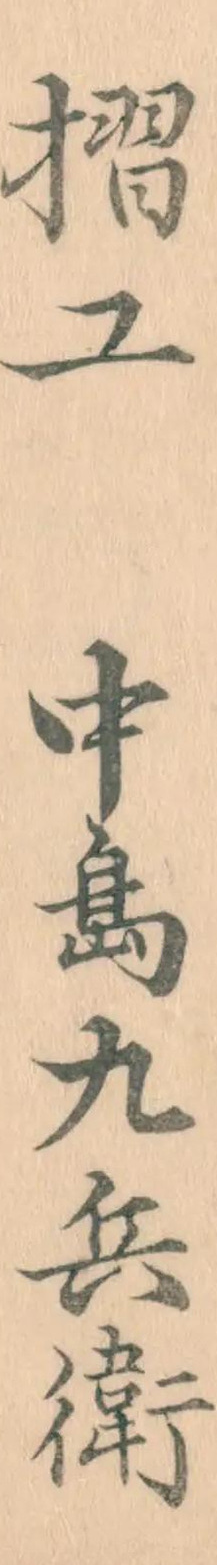摺工中島九兵衛
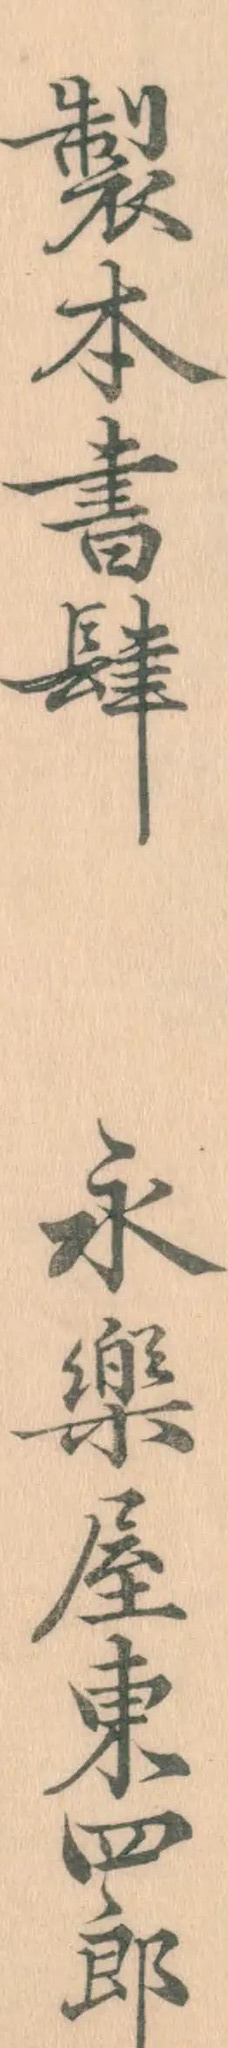製本書肆永楽屋東四郎
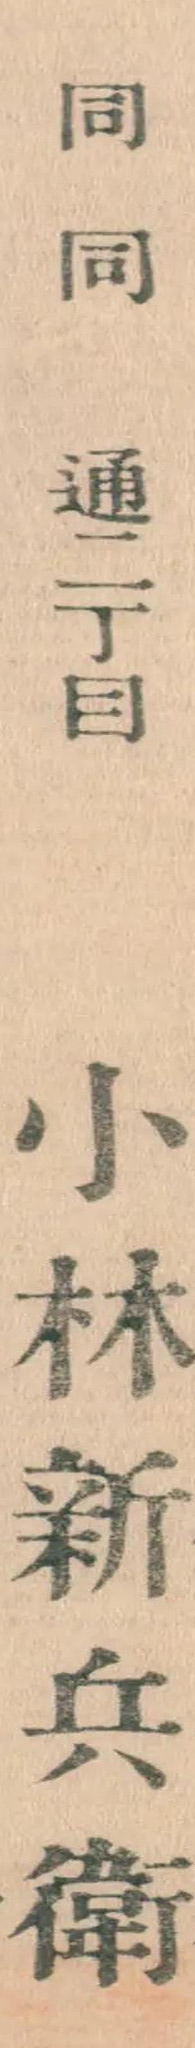同同通二丁目小林新兵衛
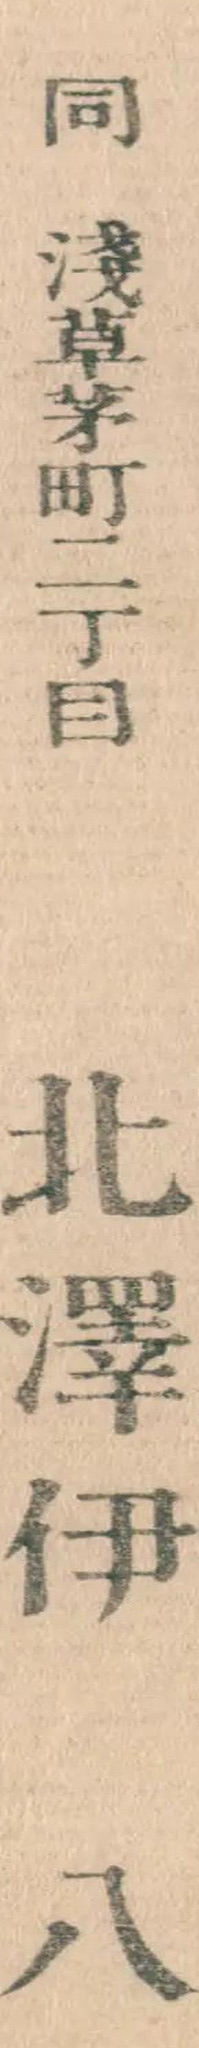同浅草茅町二丁目北沢伊八
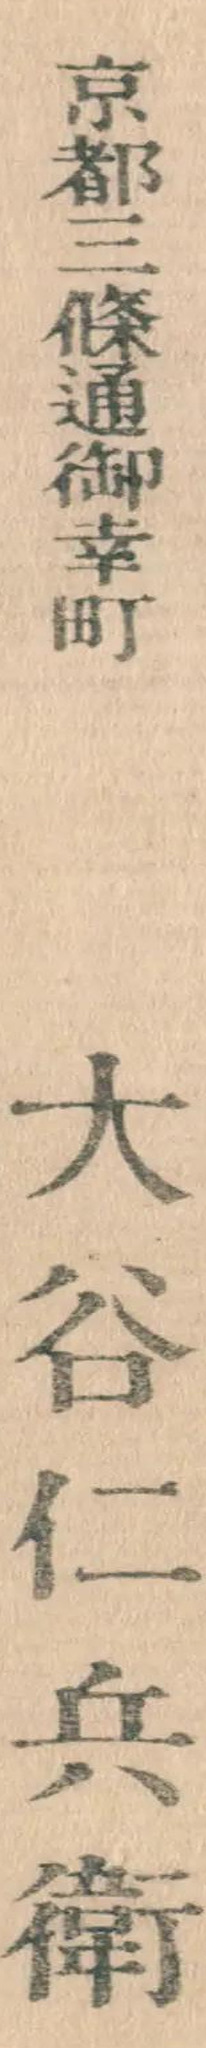京都三条通御幸町大谷仁兵衛
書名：有毒草木図説 2巻. [2]
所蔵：国立国会図書館 National Diet Library, JAPAN
